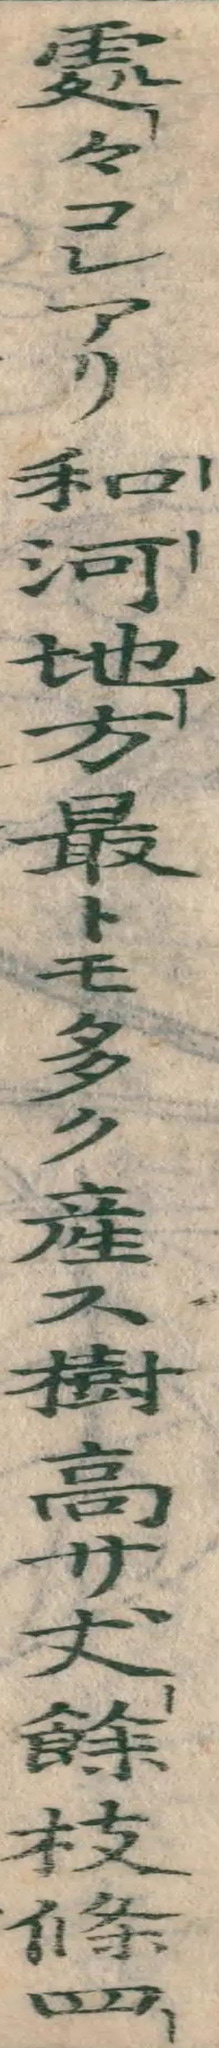処-々コレアリ和河地-方最トモ多ク産ス樹高サ丈-余枝条四-
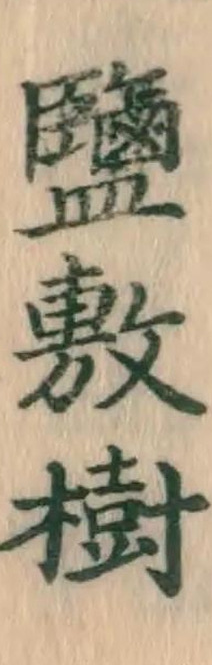塩敷樹

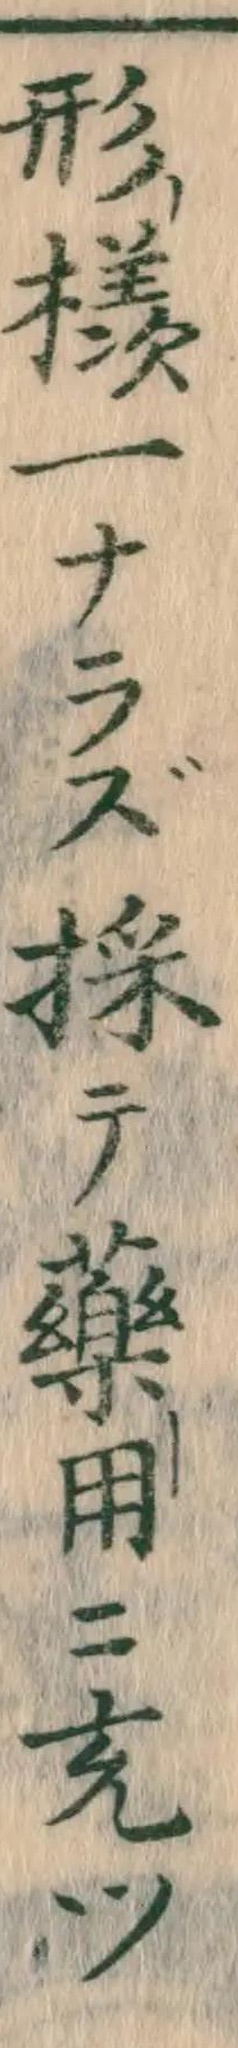形-様一ナラズ採テ薬-用ニ充ツ
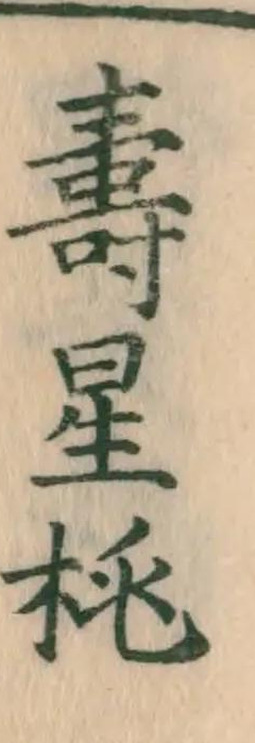寿星桃

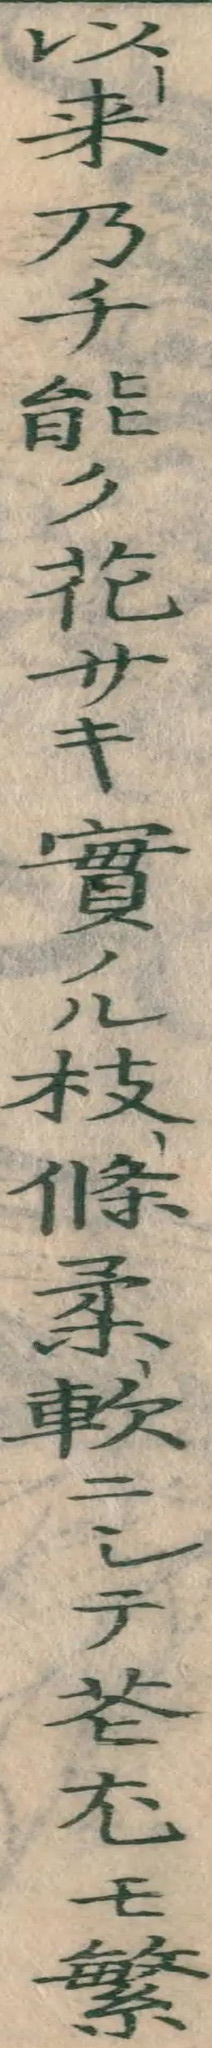以-来乃チ能ク花サキ実ノル枝-条柔-軟ニシテ花尤モ繁
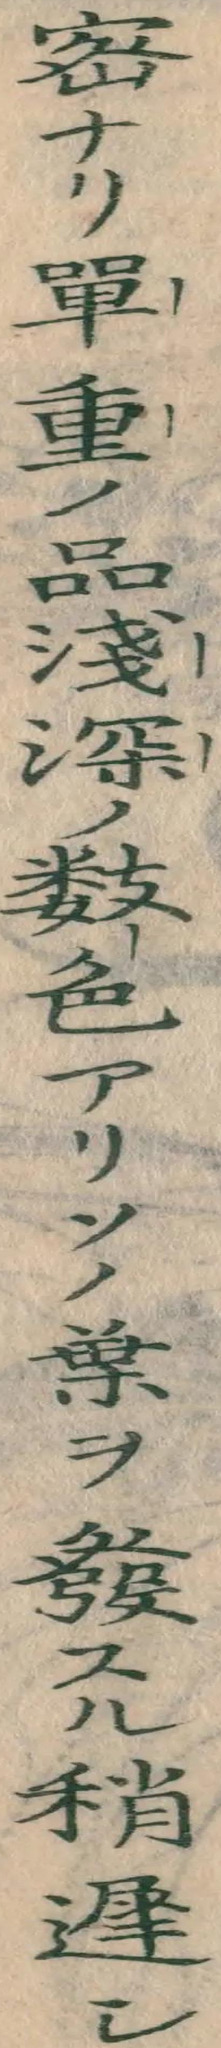密ナリ単重ノ品浅深ノ数-色アリソノ葉ヲ発スル稍遅シ
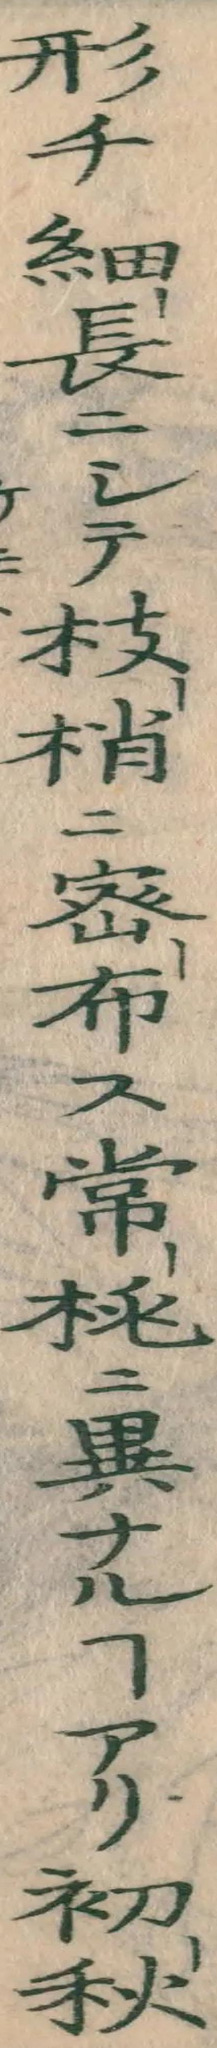形チ細-長ニシテ枝-梢ニ密-布ス常-桃ニ異ナルヿアリ初-秋
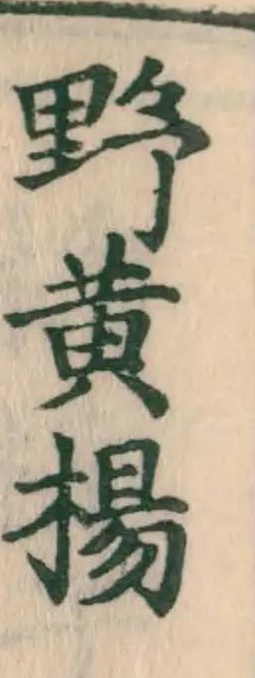野黄楊

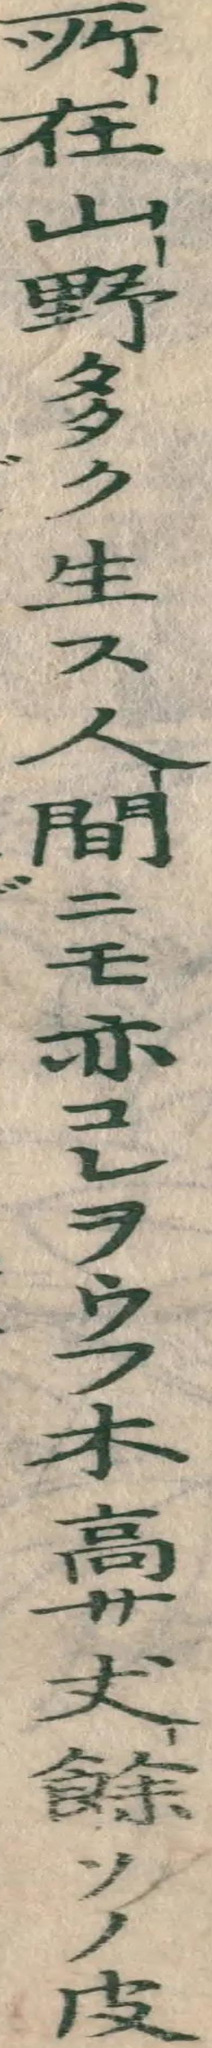所-在山-野多ク生ス人-間ニモ亦コレヲウフ木高サ丈-余ソノ皮
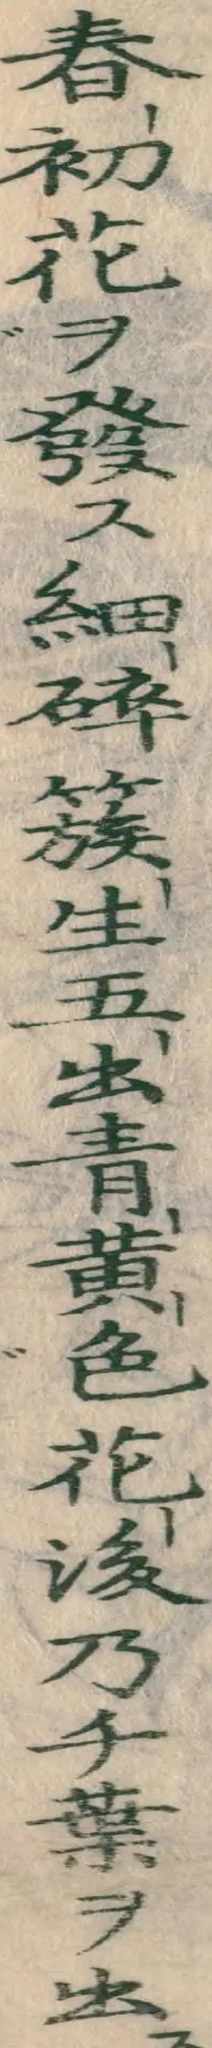春-初花ヲ発ス細-砕簇-生五-出青-黄-色花-後乃チ葉ヲ出

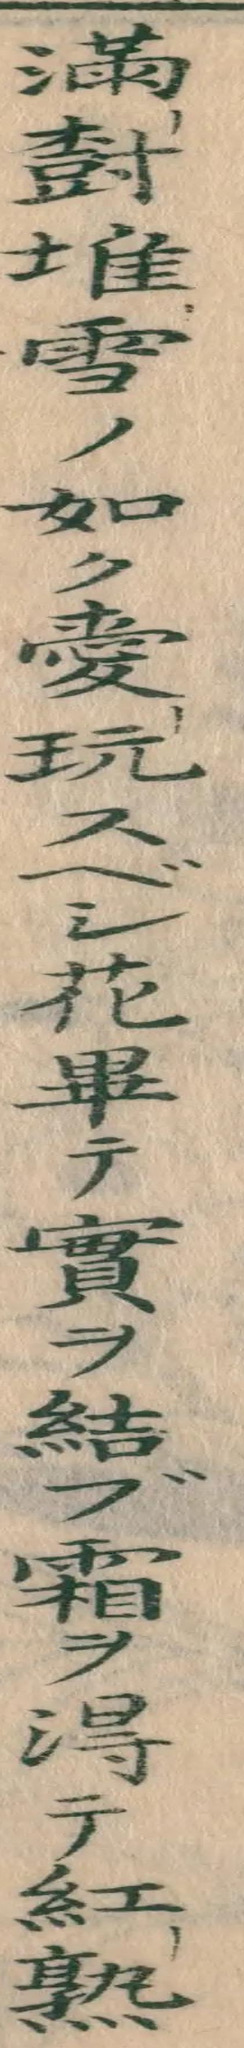満-樹堆-雪ノ如ク愛-玩スベシ花畢テ実ヲ結ブ霜ヲ得テ紅-熟

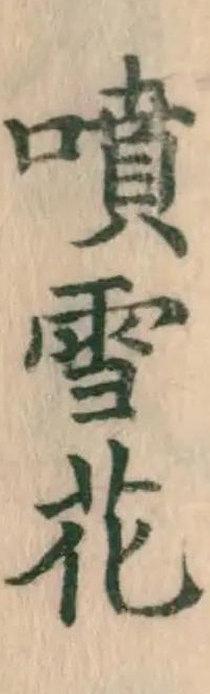噴雪花

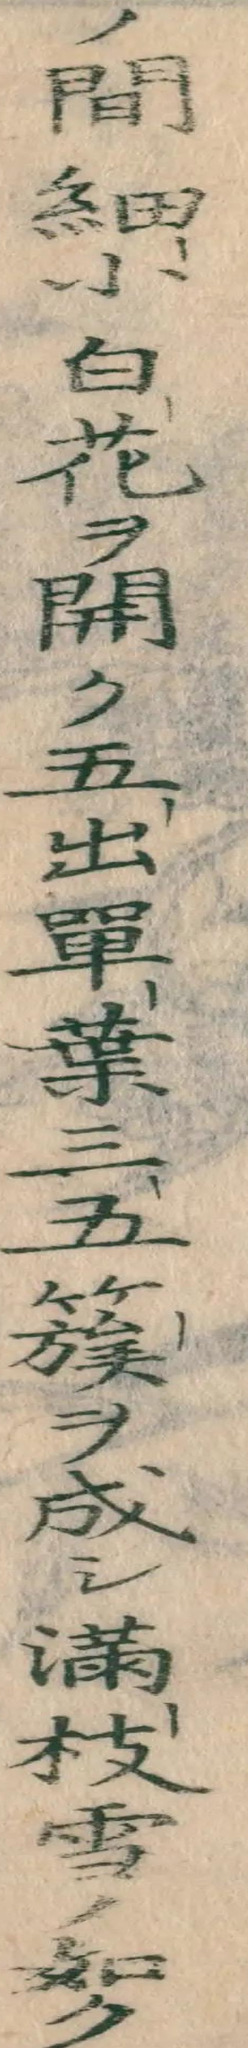ノ間細-小白-花ヲ開ク五-出単-葉三-五簇ヲ成シ満-枝雪ノ如ク
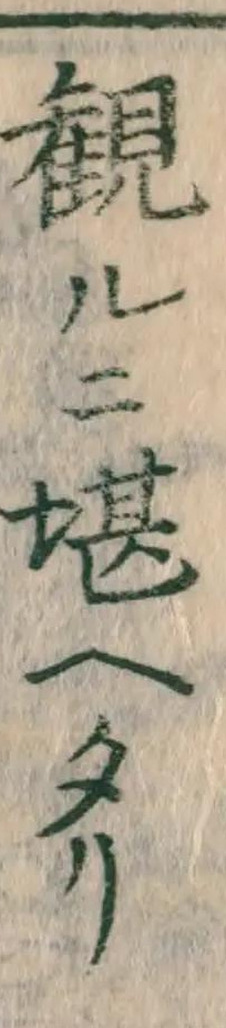観ルニ堪ヘタリ

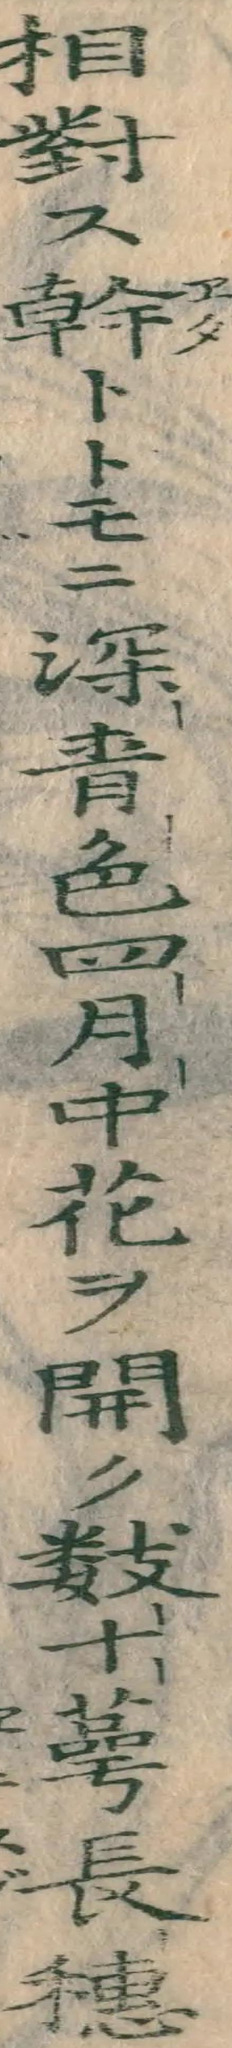相対ス幹トトモニ深-青-色四-月-中花ヲ開ク数-十-萼長-穂
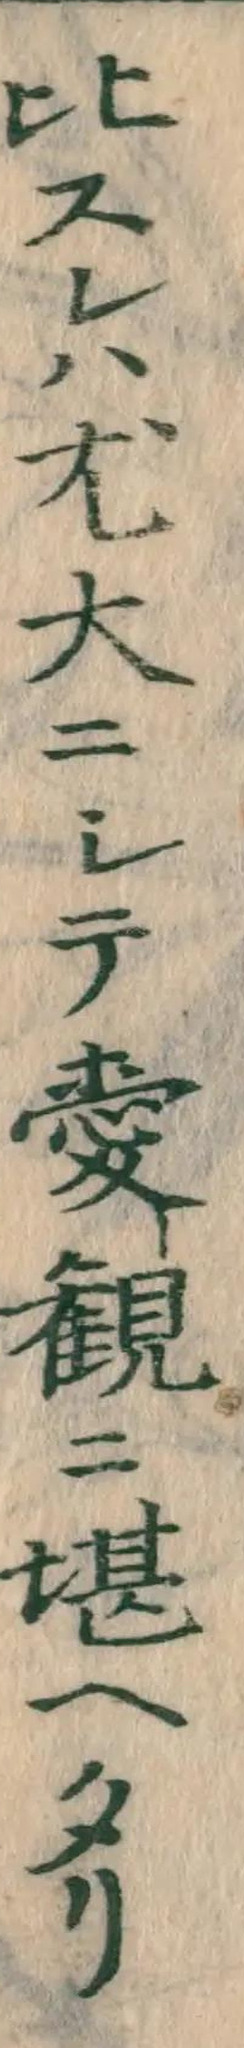比スレハ尤大ニシテ愛-観ニ堪ヘタリ
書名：花彙 草部4巻木部4巻. [2]
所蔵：国立国会図書館 National Diet Library, JAPAN
